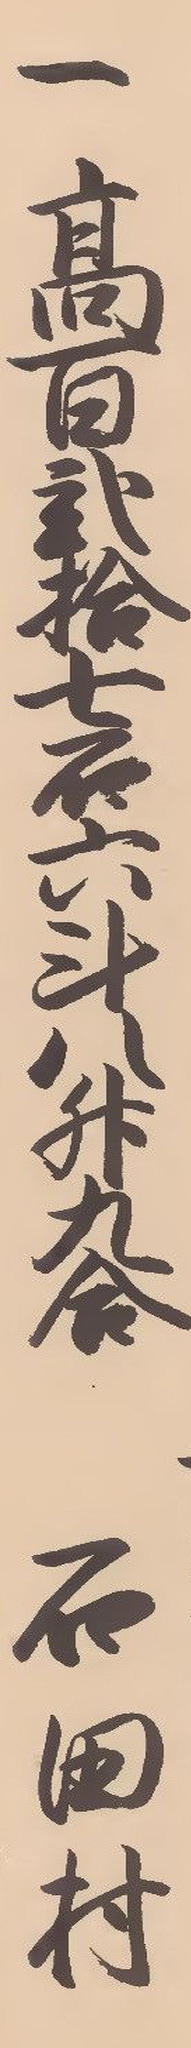一高百弐拾七石六斗八升九合石田村
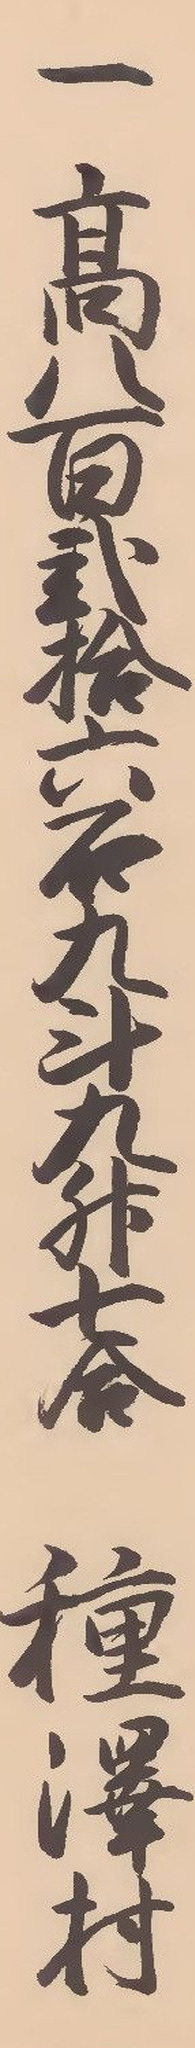一高八百弐拾六石九斗九升七合種沢村
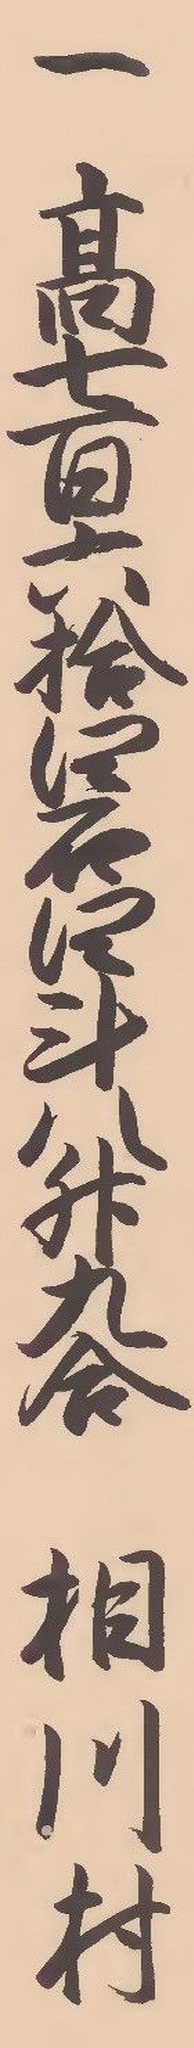一高七百六拾四石四斗八升九合相川村
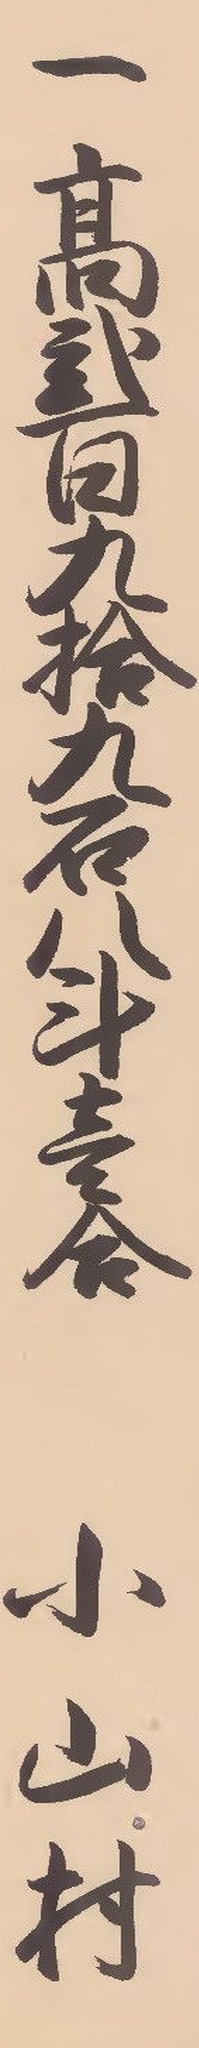一高弐百九拾九石八斗壱合小山村
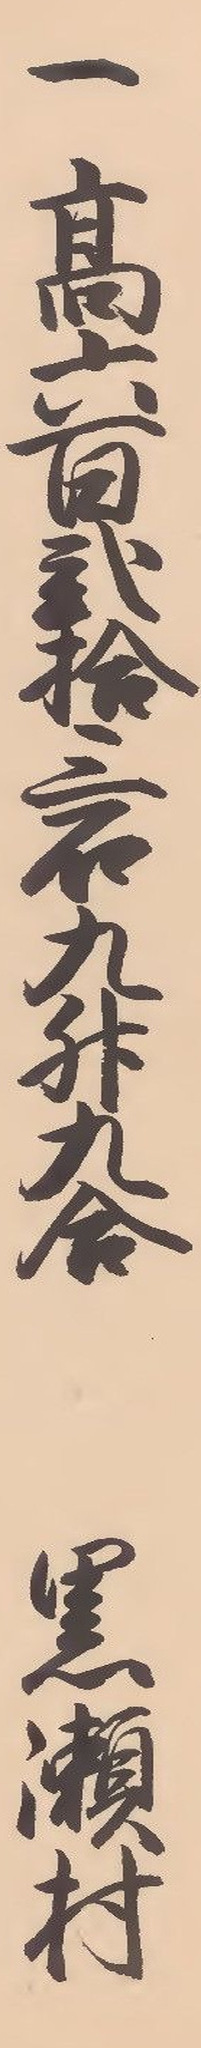一高六百弐拾三石九升九合黒瀬村
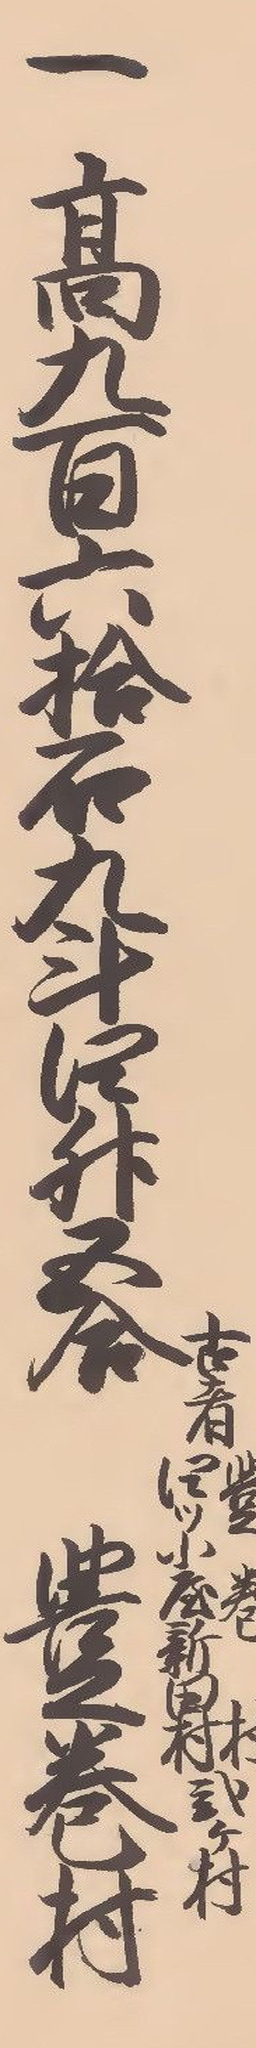一高九百六拾石九斗四升五合豊巻村
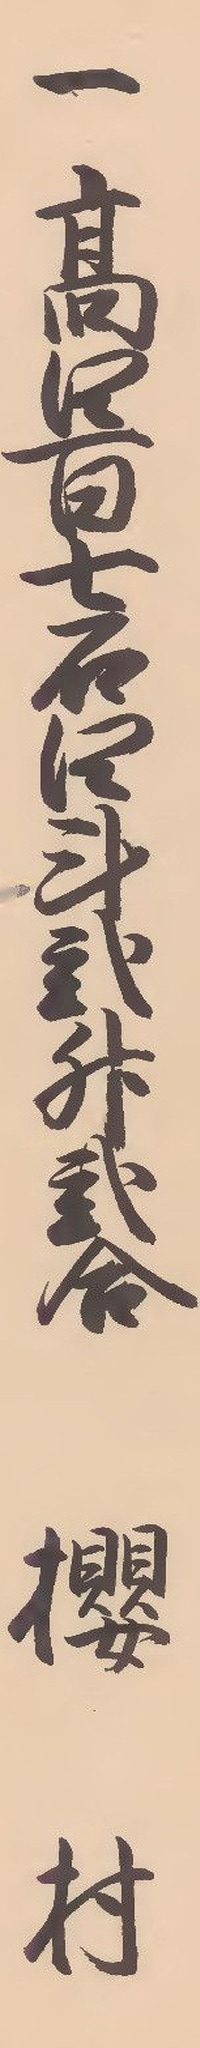一高四百七石四斗弐升弐合桜村

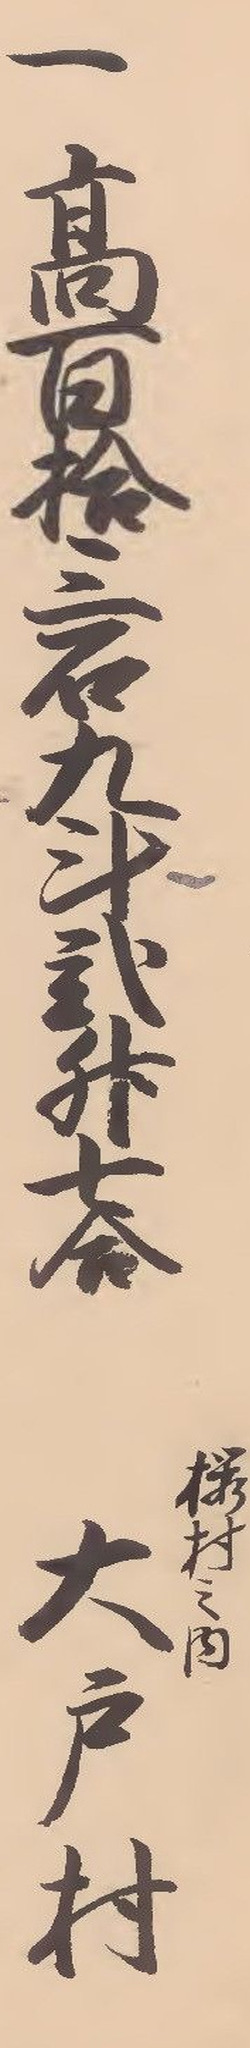一高百拾三石九斗弐升七合大戸村
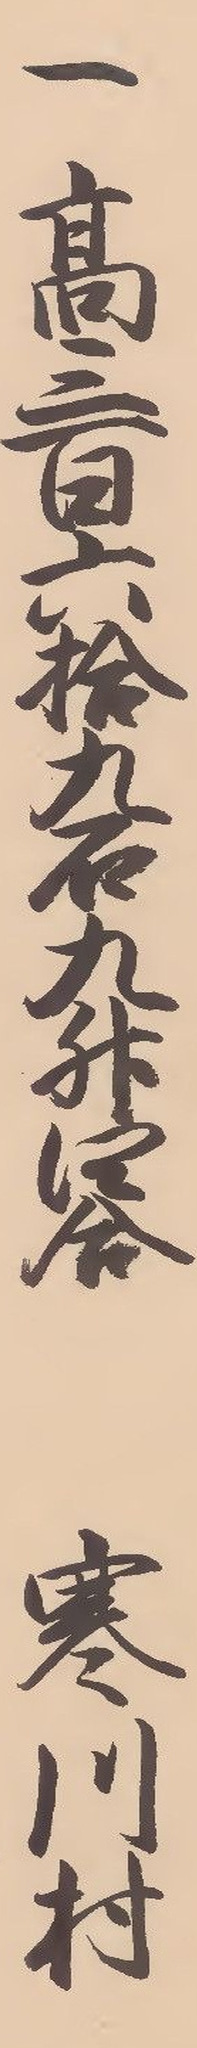一高三百六拾九石九升四合寒川村
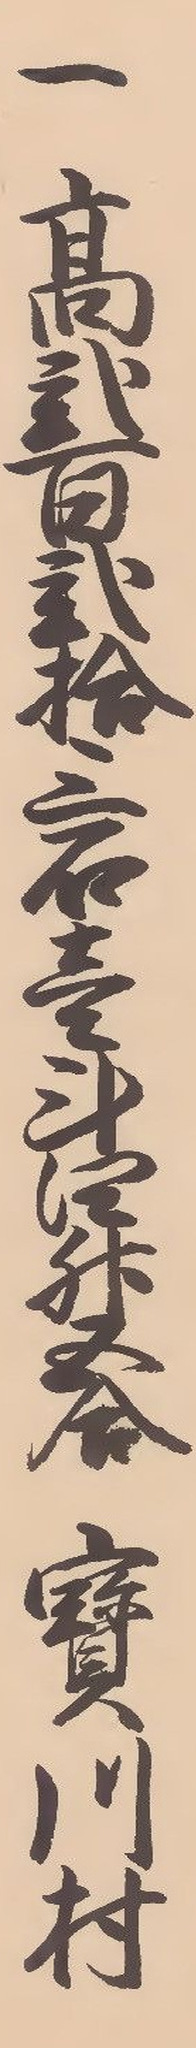一高弐百弐拾三石壱斗四升五合宝川村
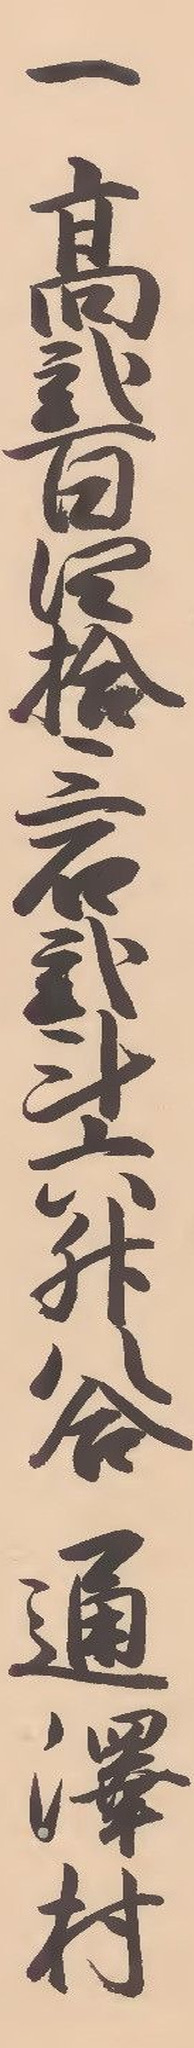一高弐百四拾三石弐斗六升八合通沢村
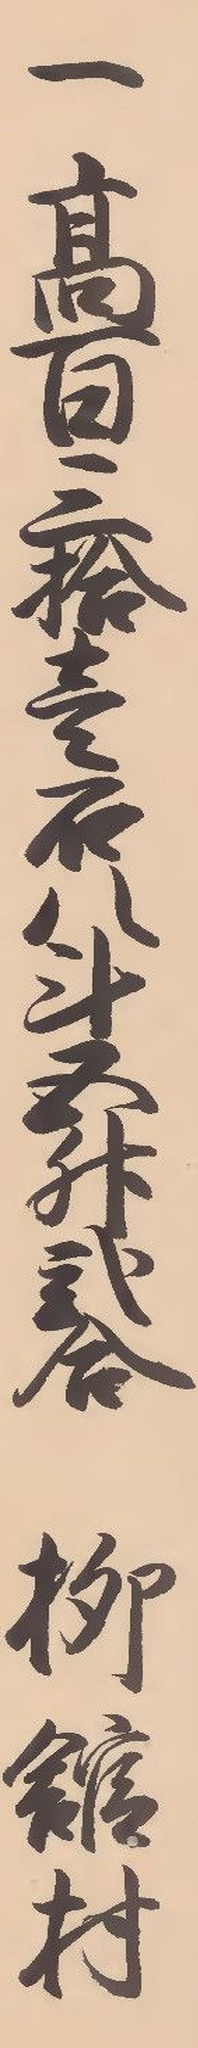一高百三拾壱石八斗五升弐合柳館村
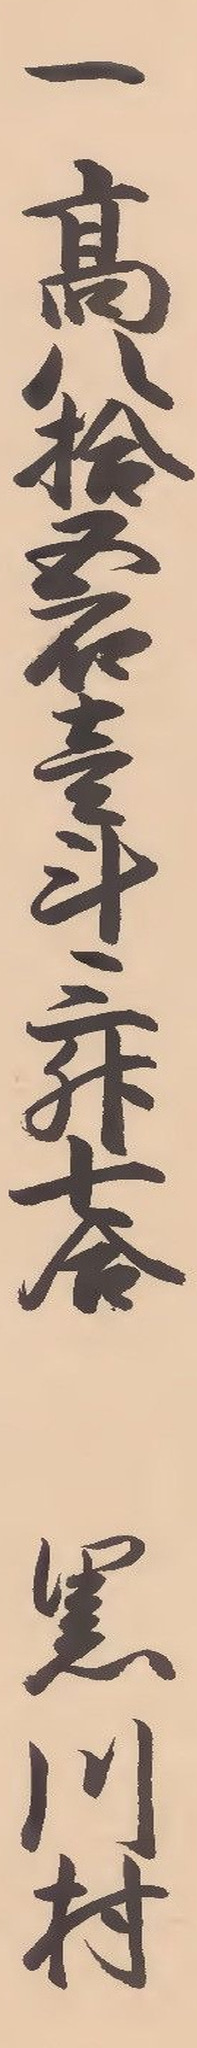一高八拾五石壱斗三升七合黒川村
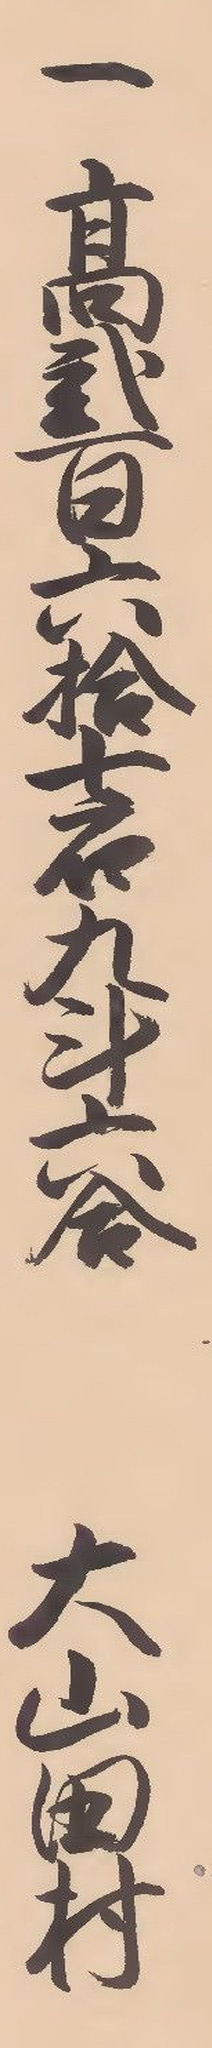一高弐百六拾七石九斗六合大山田村
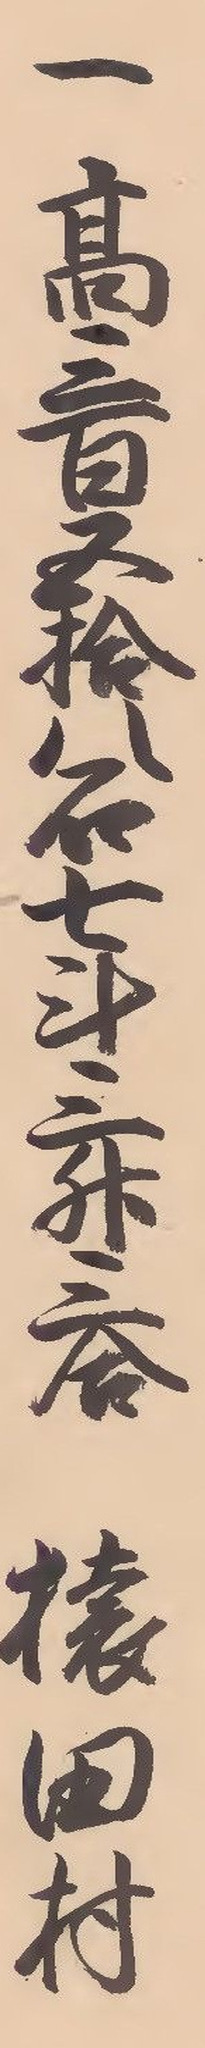一高三百五拾八石七斗三升三合猿田村

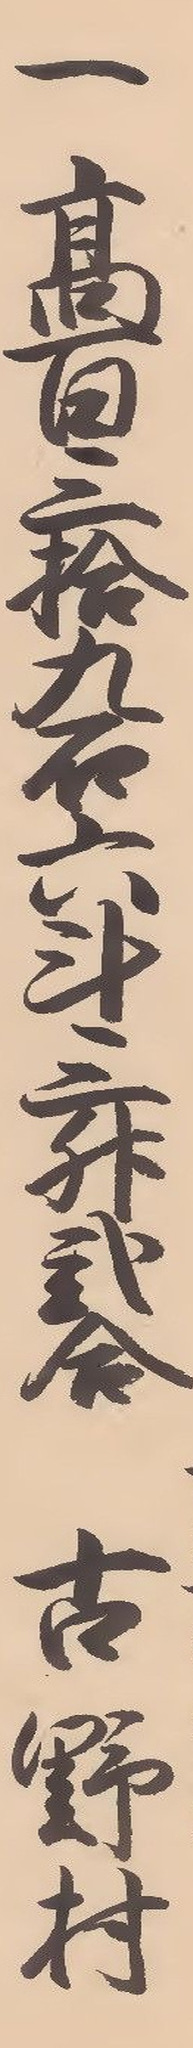一高百三拾九石六斗三升弐合古野村
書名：出羽国郷帳　５
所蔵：国立公文書館 National Archives of Japan
